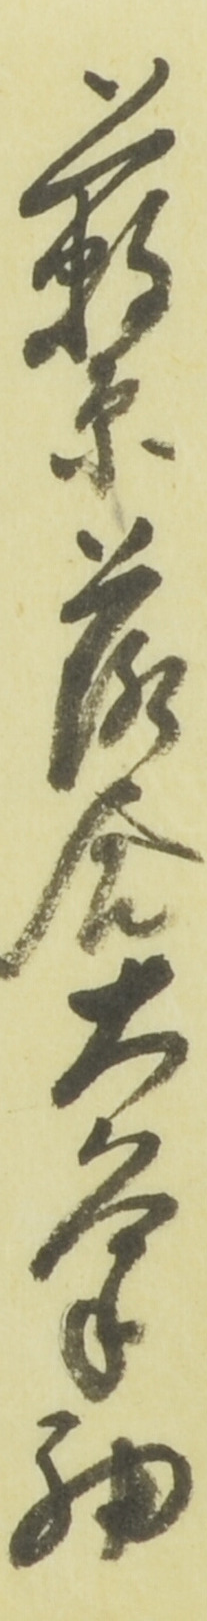藪原落合大久手細
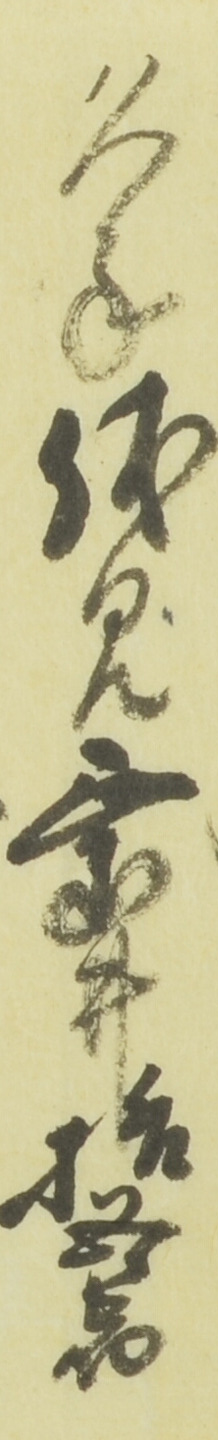久手伏見垂井拾五ヶ宿
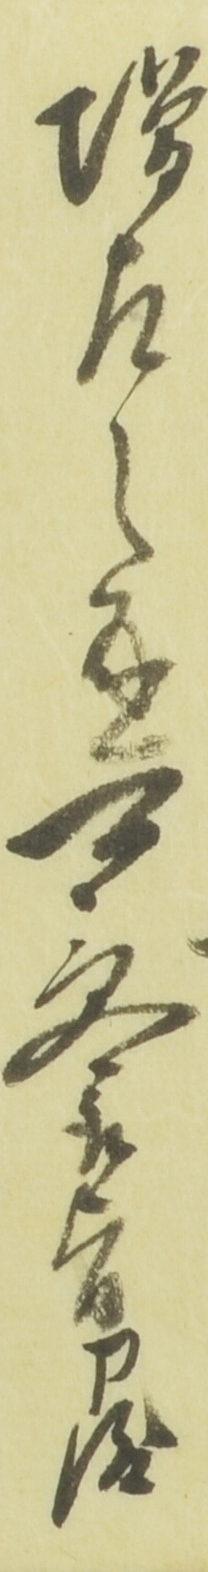増左之通可受取旨申渡
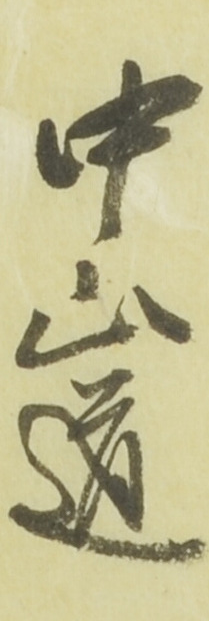中山道
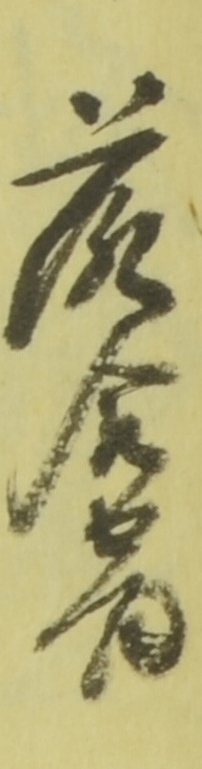落合宿

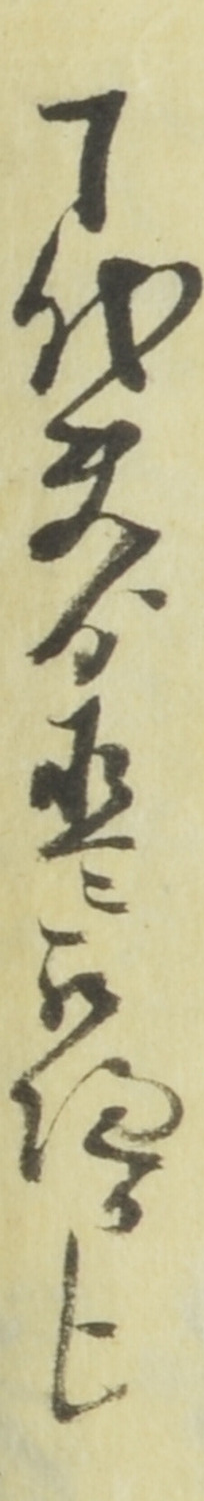丁代夫ゟ直ニ被拘り申候
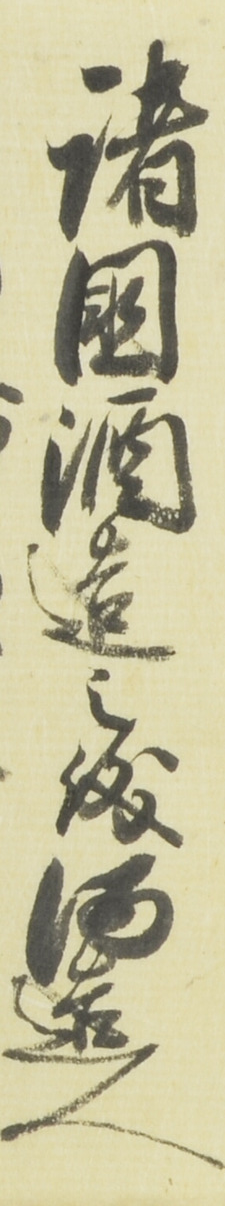諸国酒造之儀酒造人
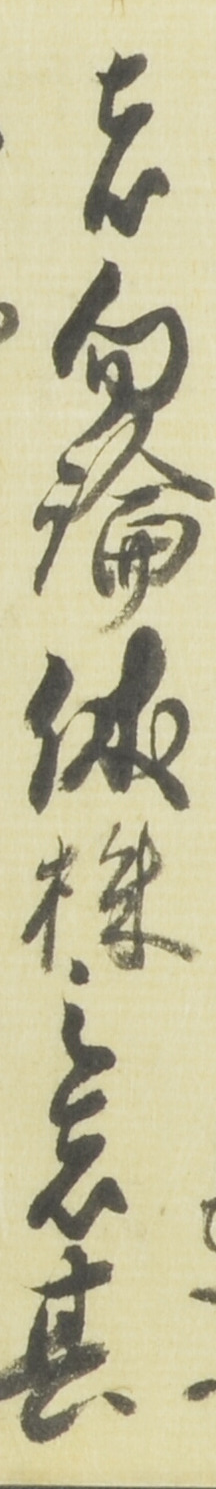は勿論休株之意其
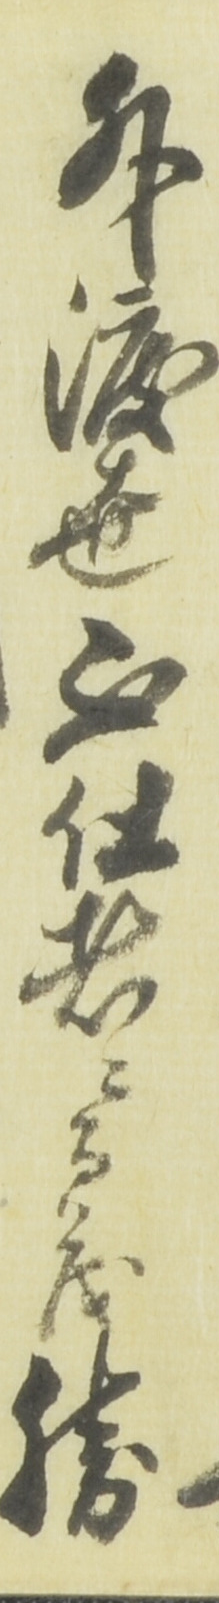外渡世不仕者ニ而も勝
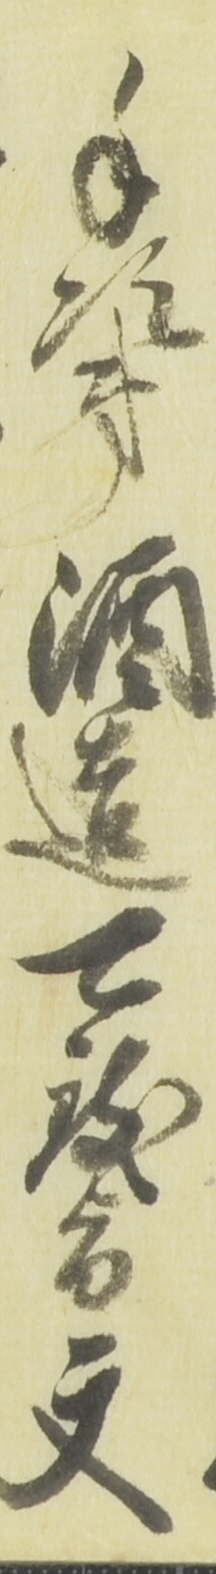手次第酒造可致旨文
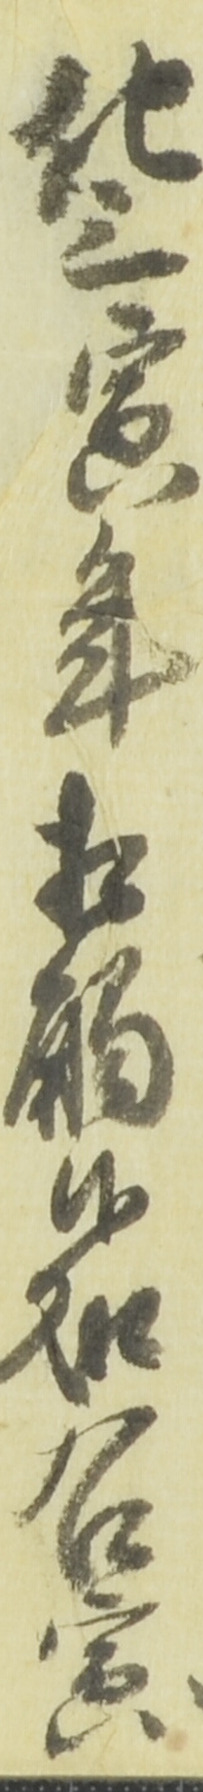化三寅年相触候処右寅
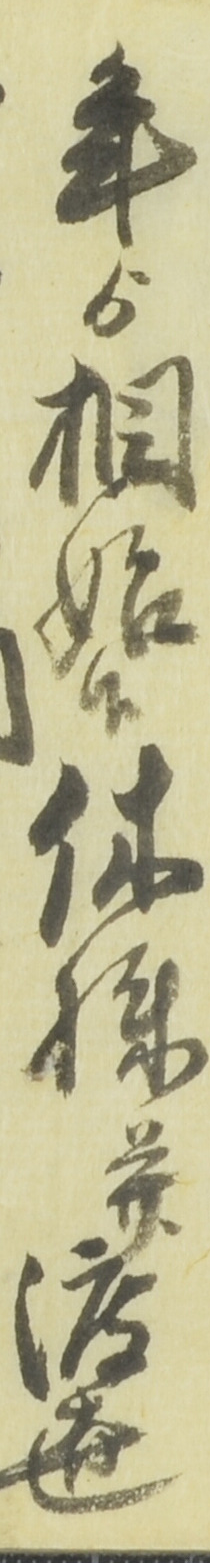年ゟ相始候休株并渡世
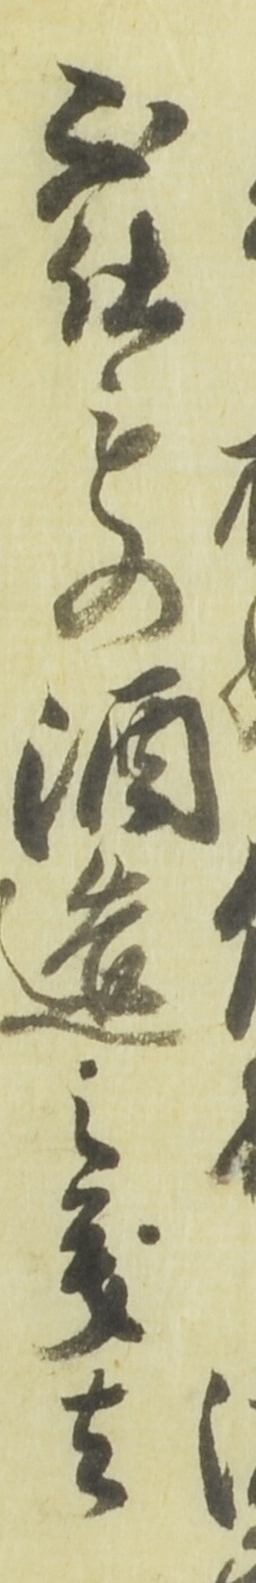不仕もの酒造之義は
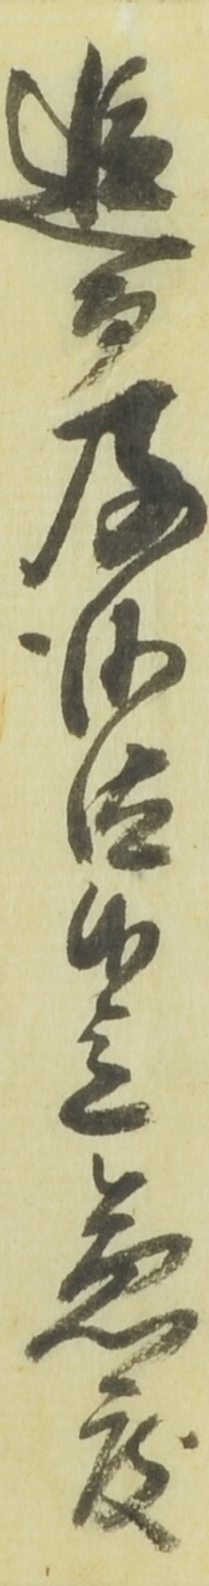追而及沙汰候迄急度
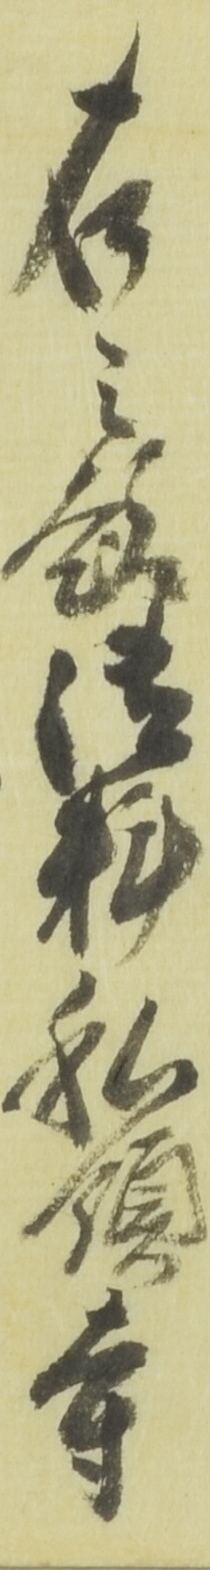右之趣御料私領寺
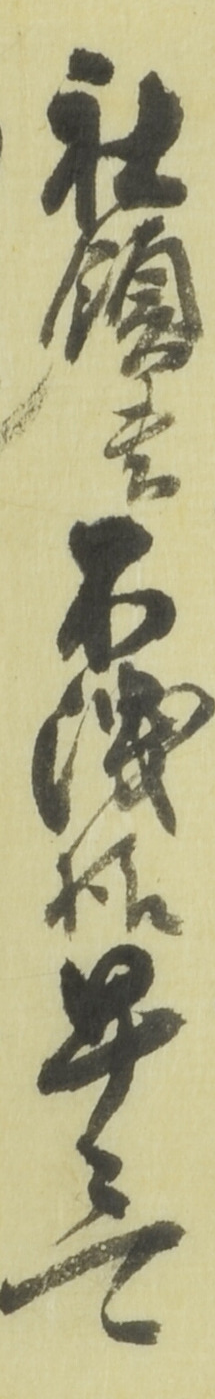社領共不洩様早々可
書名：御触書御書附控
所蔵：伊那市立高遠町図書館・合同会社AMANE
